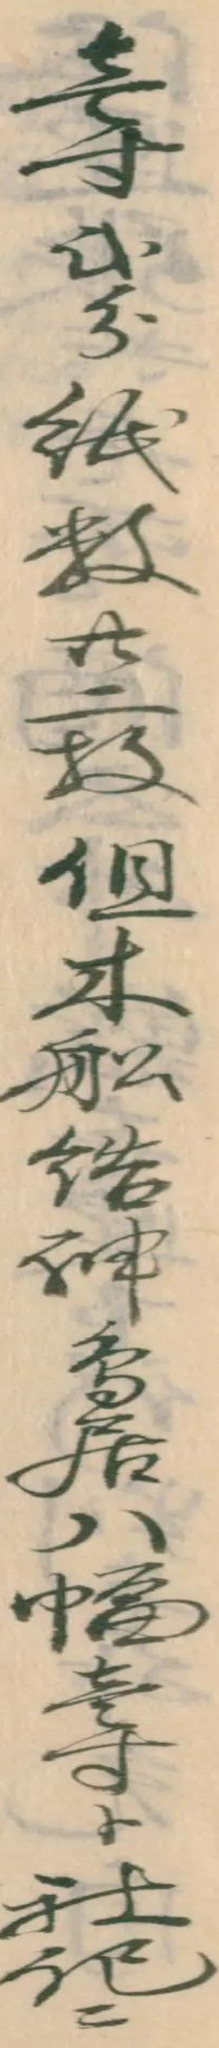壱寸弐分紙数廿二枚但木船結神鳥居ハ幅壱寸ト社記ニ
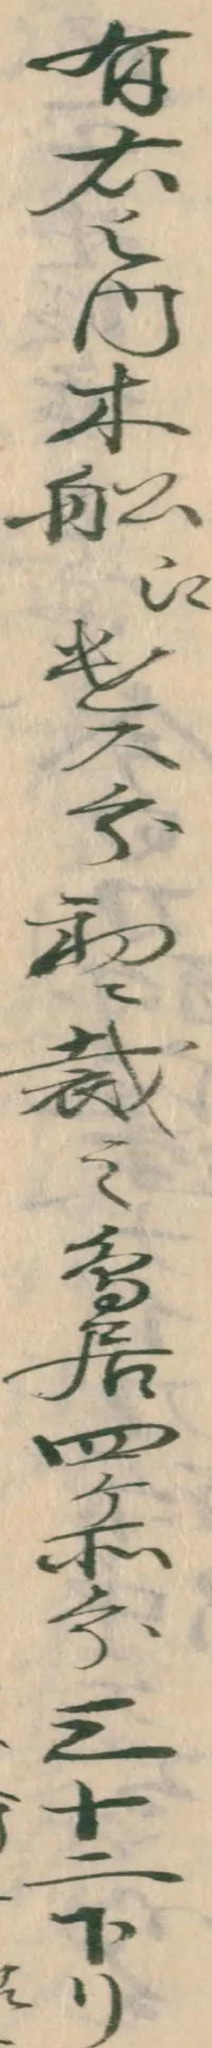有右之内木舩江遣ス分初ニ裁之鳥居四ケ所分三十二下リ
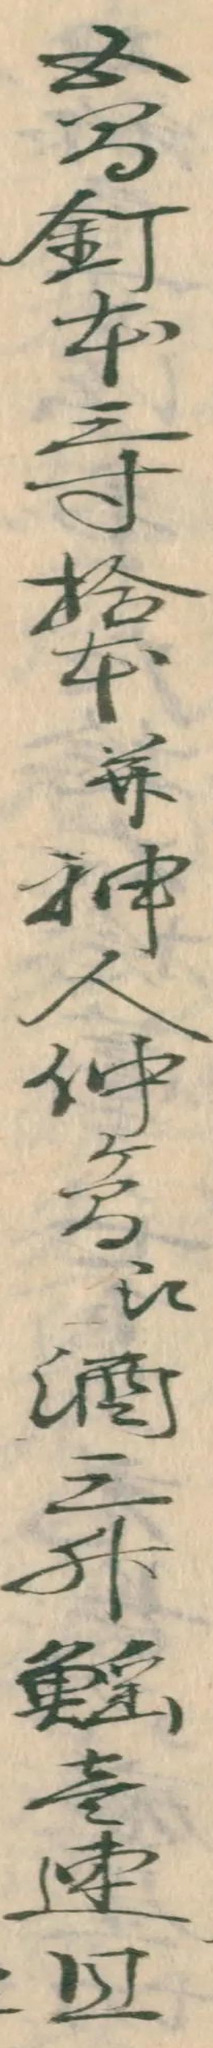五間釘本三寸拾本并神人仲ヶ間江酒三升鰩壱連且
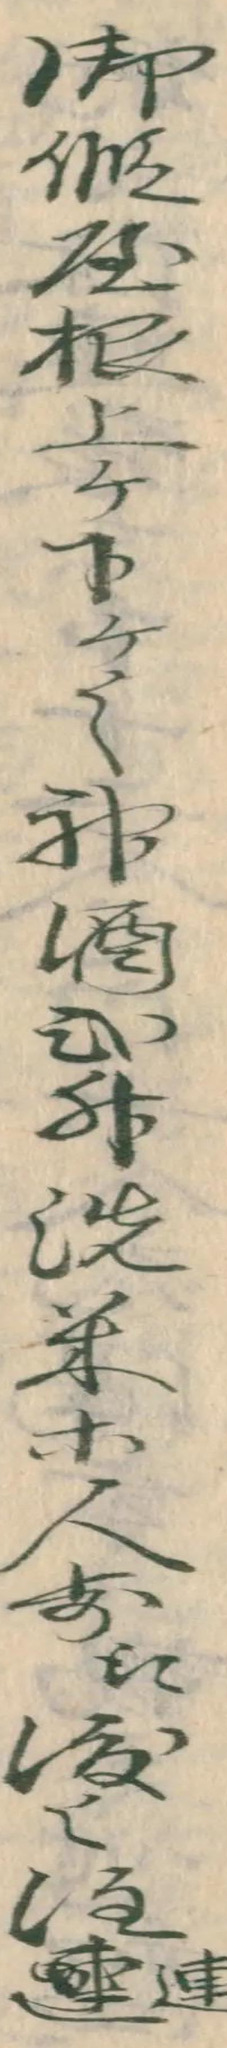御仮屋根上ケ下ケ之神酒弐升洗米等人歩江渡之注連
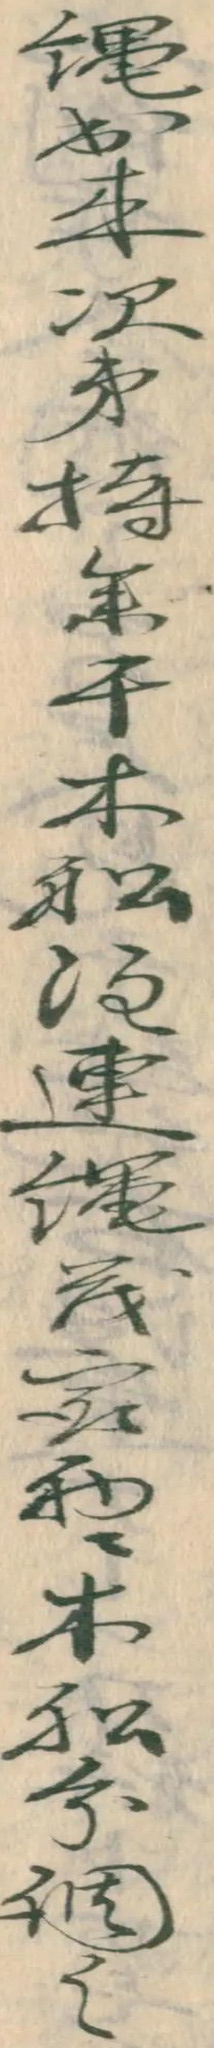縄出来次第持参于木船注連縄茂最初ニ木船分調之
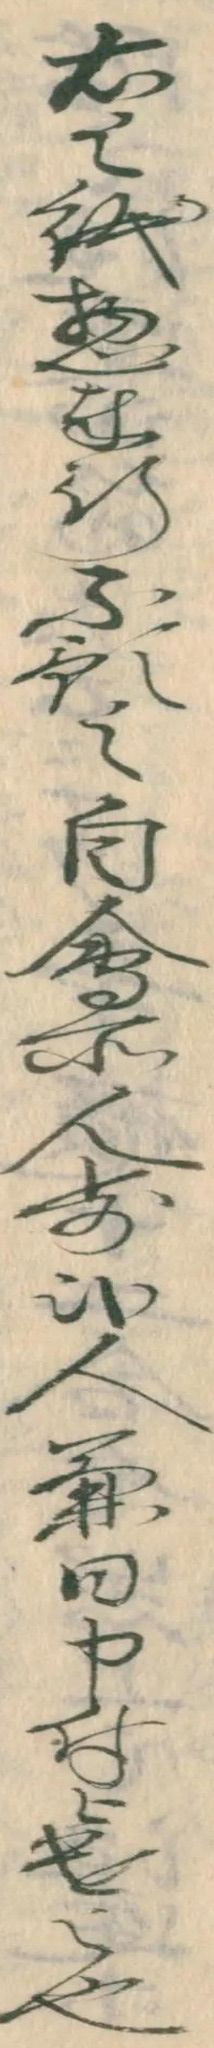右之紙惣奉行不預之自会所人歩弐人兼日申付被遣之也
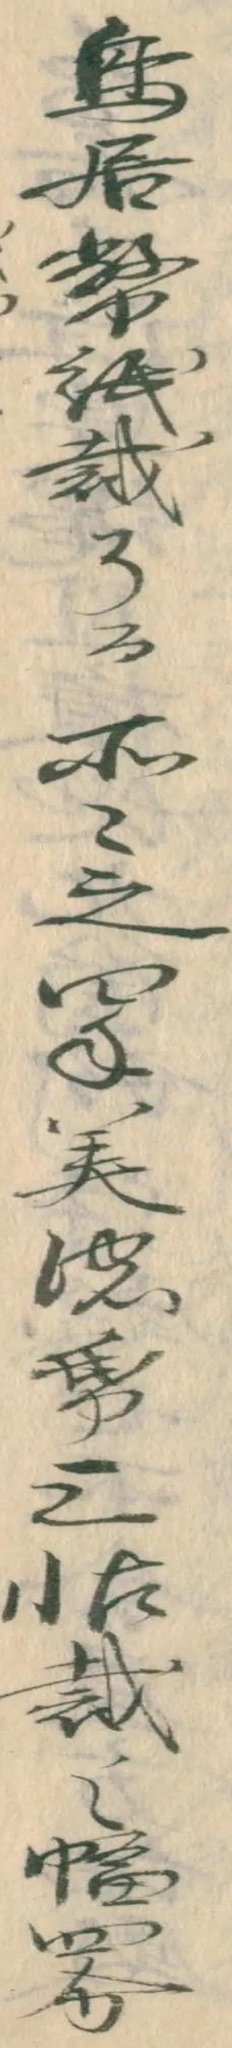鳥居幣紙裁了而所々之四手美濃紙三帖裁之幅四分
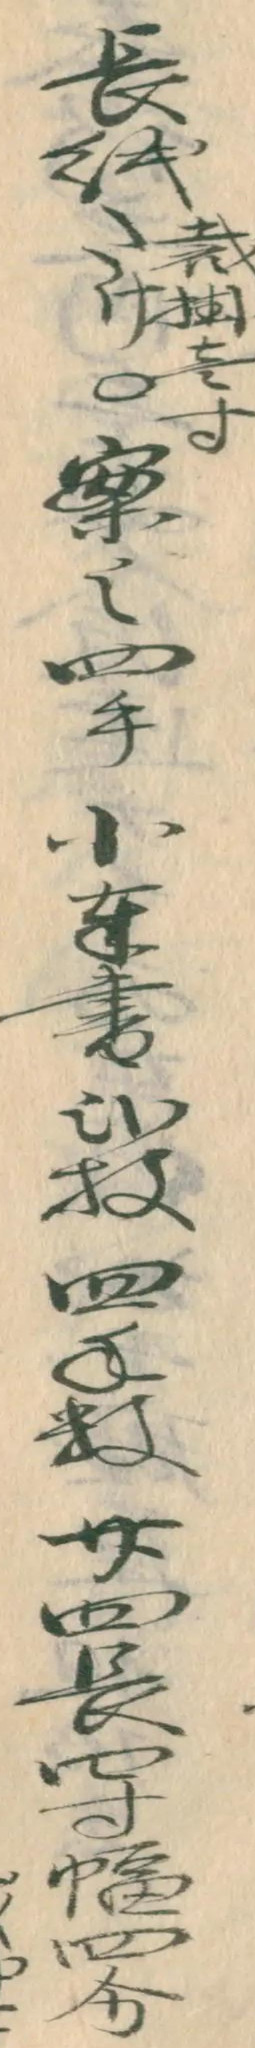長紙たけ◦案之四手小奉書弐枚四手数廿四長四寸幅四分裁掛一寸

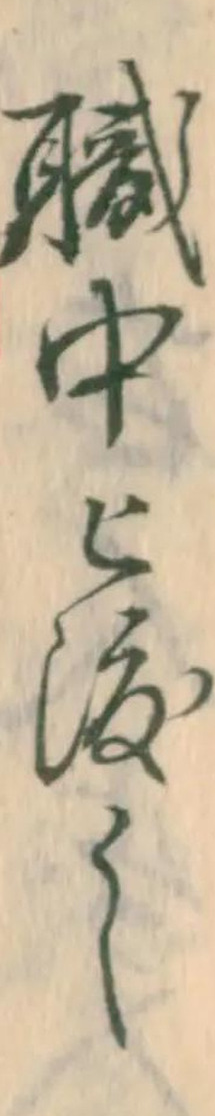職中被渡之
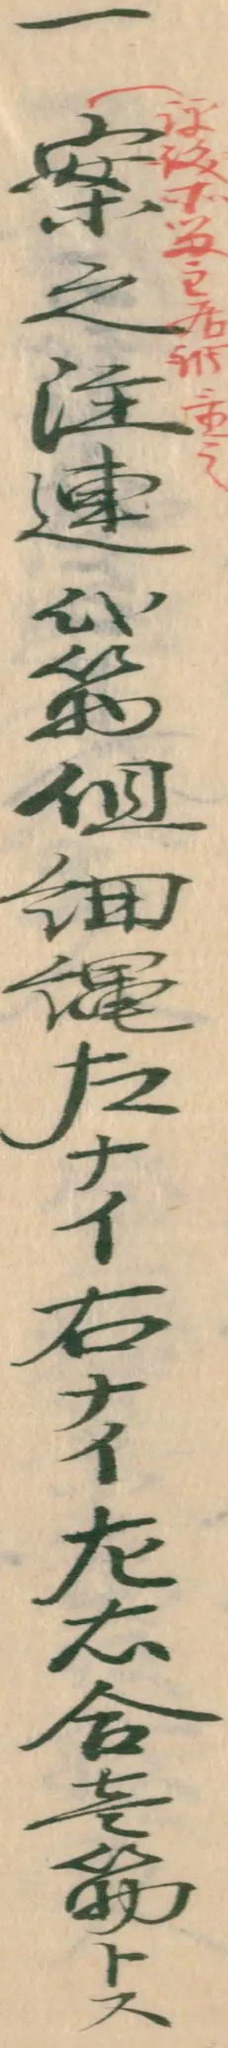一案之注連弐筋但細縄左ナイ右ナイ左右合壱筋トス
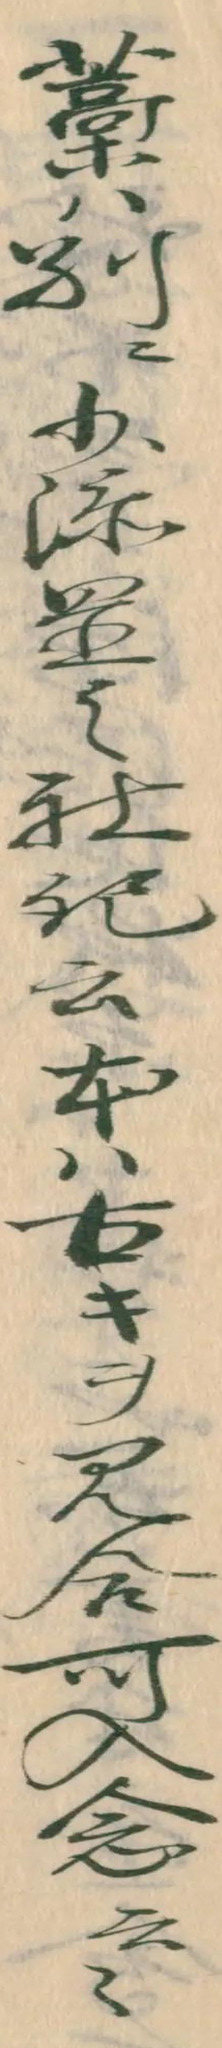藁ハ別ニ少添置之社記云本ハ古キヲ見合可入念云々
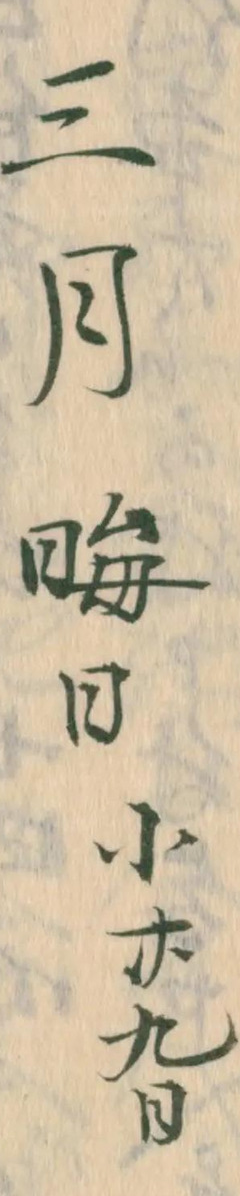三月晦日小廿九日
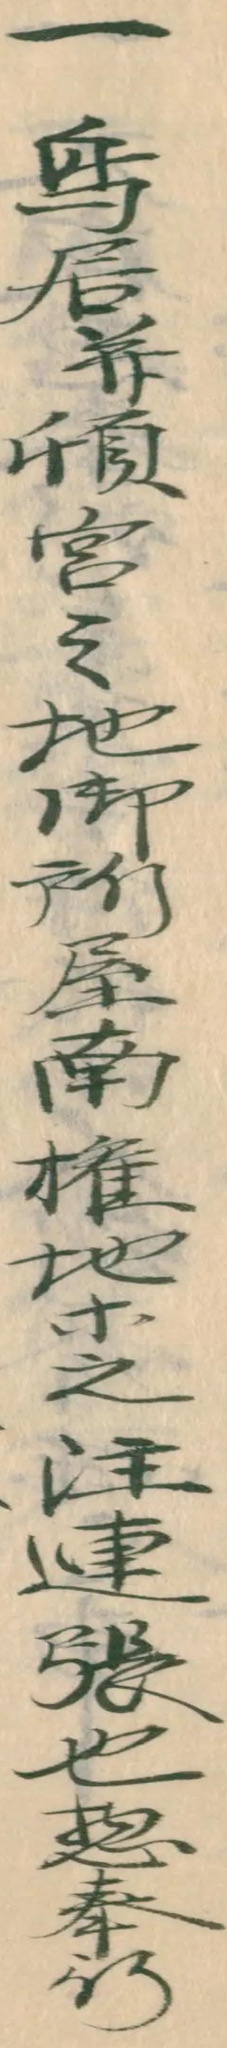一鳥居并頓官之地御所屋南権地等之注連張也惣奉行
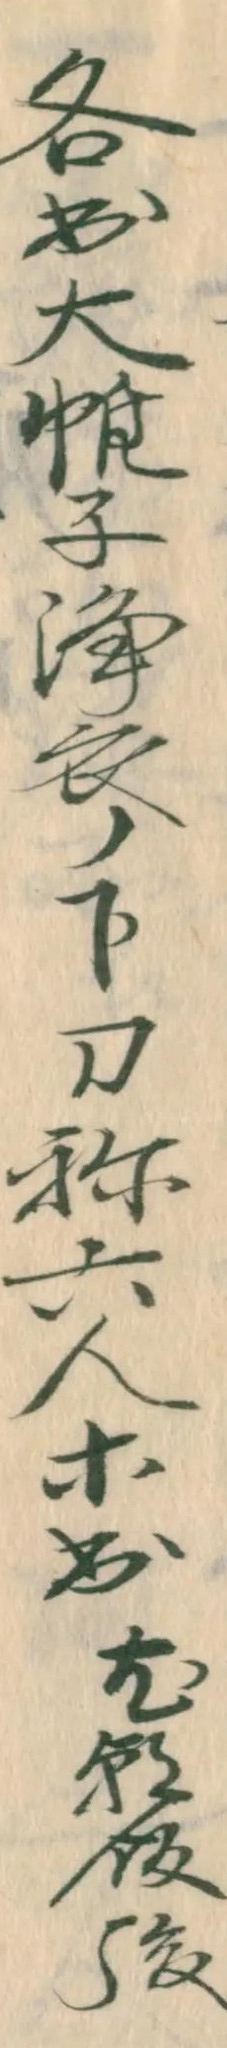各出大帷子浄衣ノ下刀祢六人等出尤朝飯後
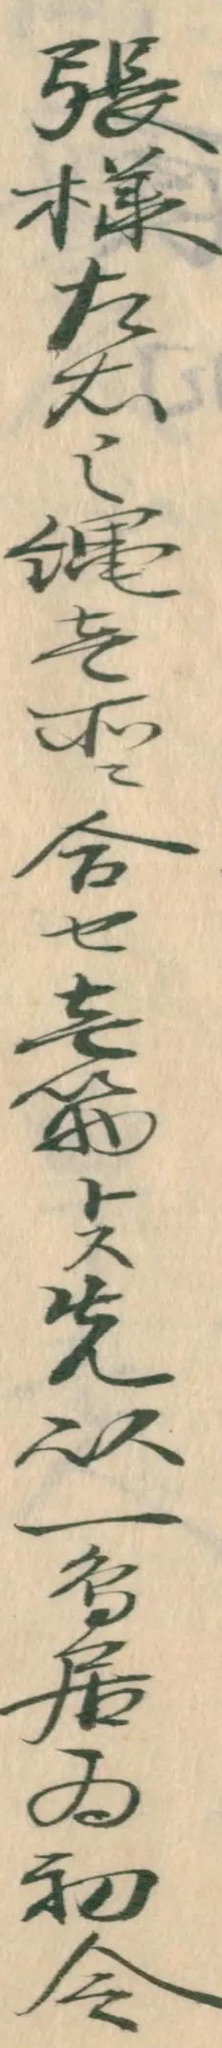張様左右之縄壱所ニ合セ壱筋トス先以一鳥居為初令
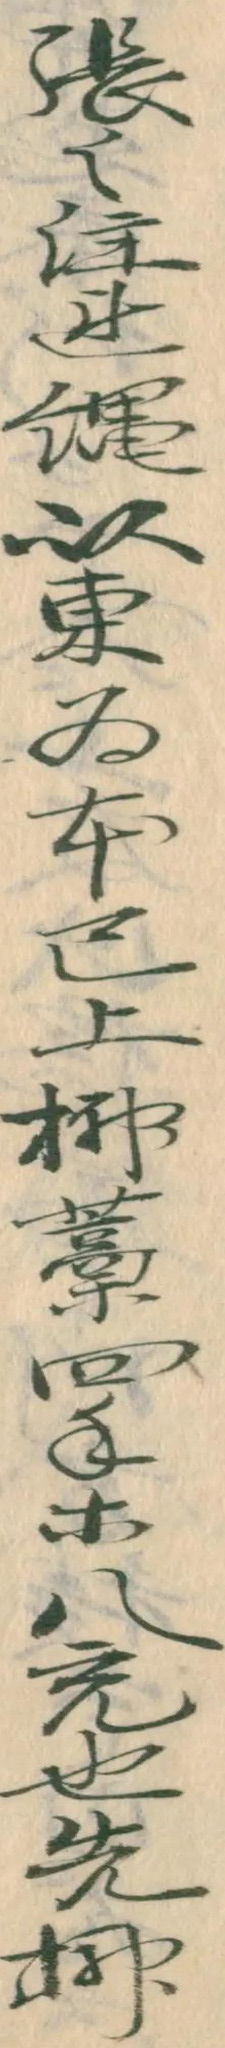張之注連縄以東為本已上榊藁四手等八充也先榊
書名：賀茂社記録. 第6冊
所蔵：国立国会図書館 National Diet Library, JAPAN
